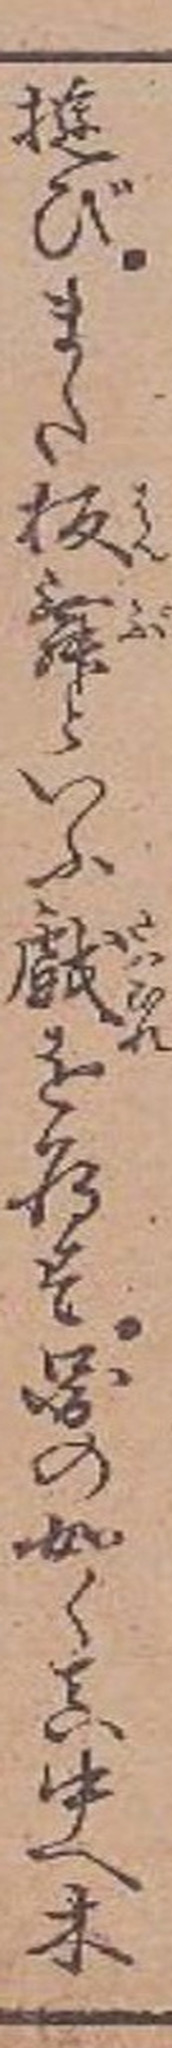遊び•また板舞といる戯を為す•図の如く真中へ木

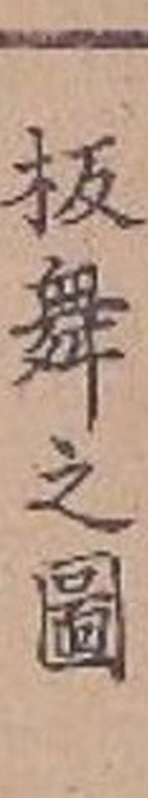板舞の図
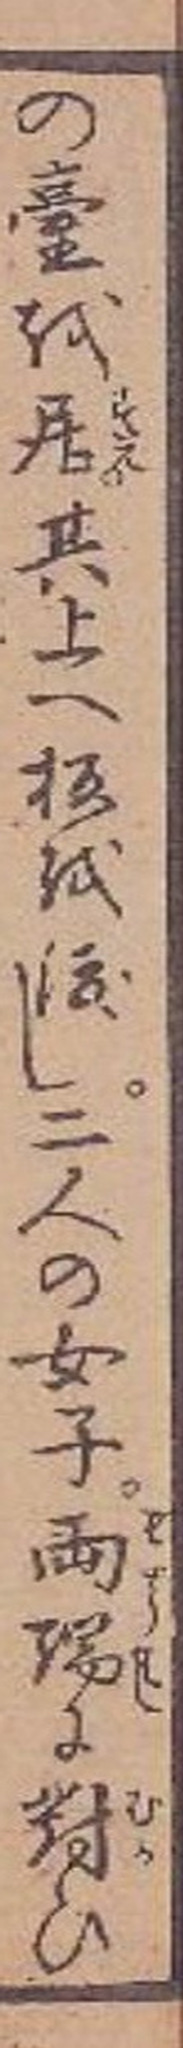の台を居。其上へ板を渡し。二人の女子。両端に対ひ
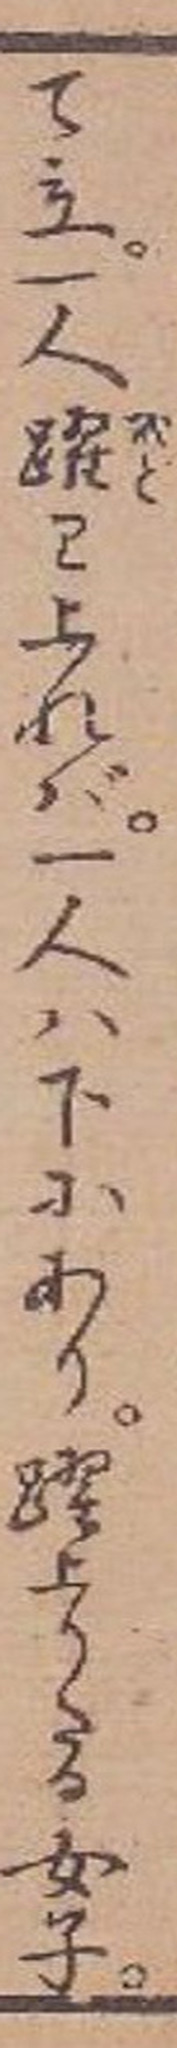て立。一人躍り上れば。一人は下にあり。躍上りたる女子。
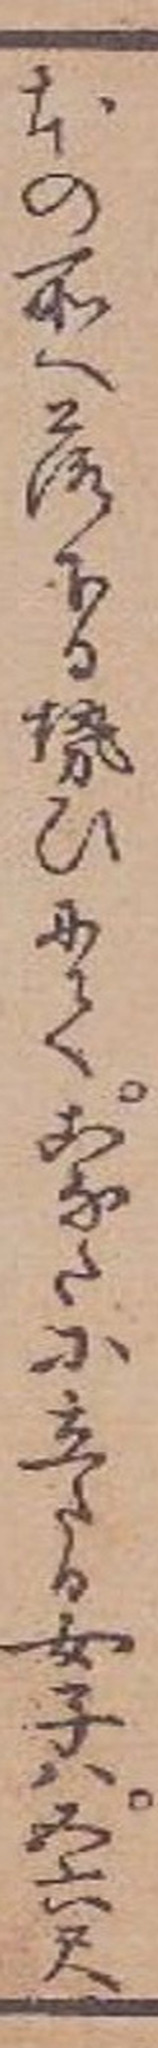本の所へ落下る勢ひにて。こなたに立ちたる女子は。五六尺
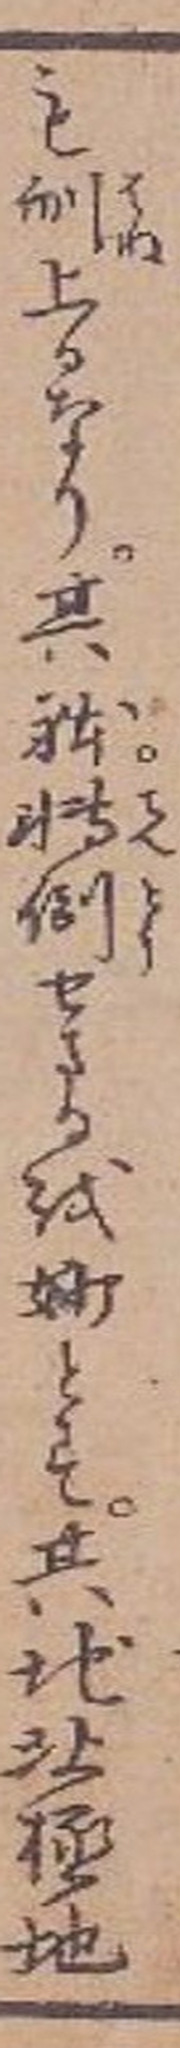も刎上るなり。其体。転倒せさるを妙とす。其地北極地
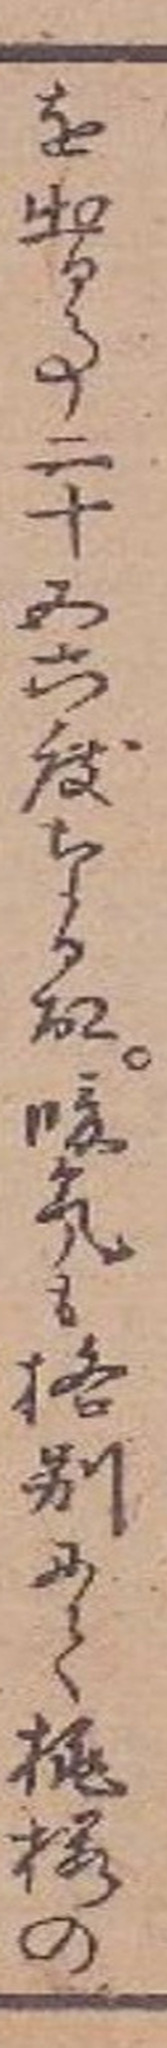を出る事二十五六度なる故。暖気も格別にて桃桜の
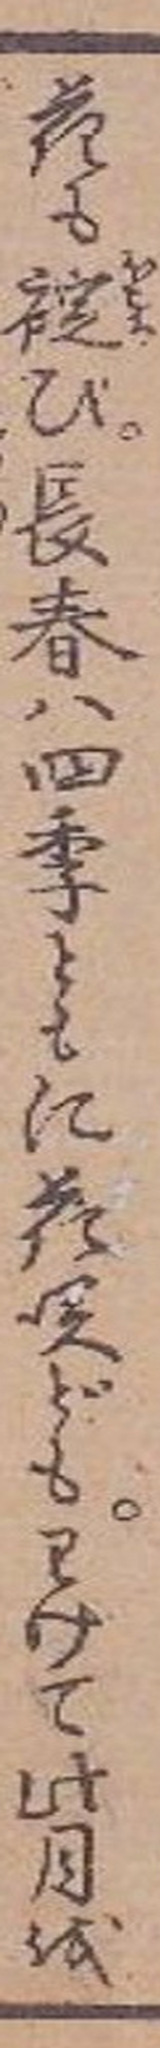花も綻び。長春は四季ともに花開ども。わけて此月を
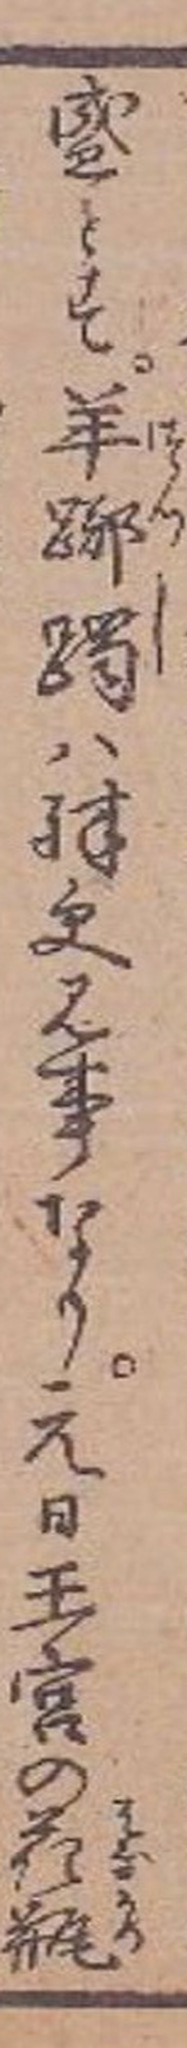盛とす。羊躑躅は殊更見事なり。元日王宮の花瓶
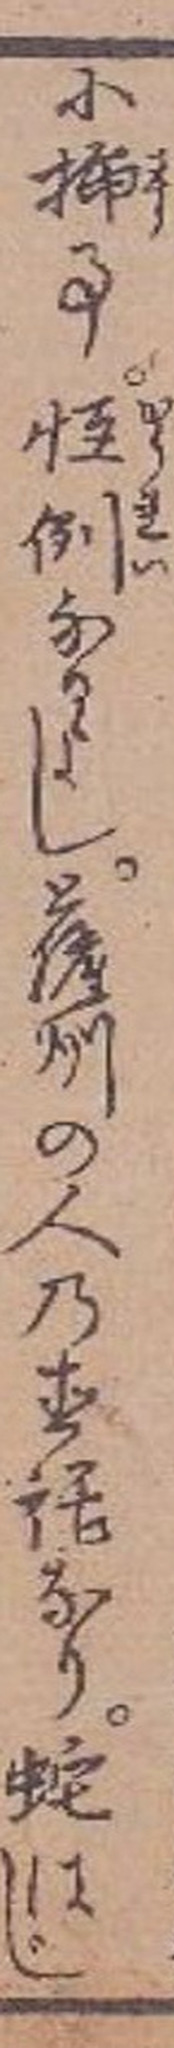に挿事。恒例なり。薩州の人の直話なり。蛇は。し
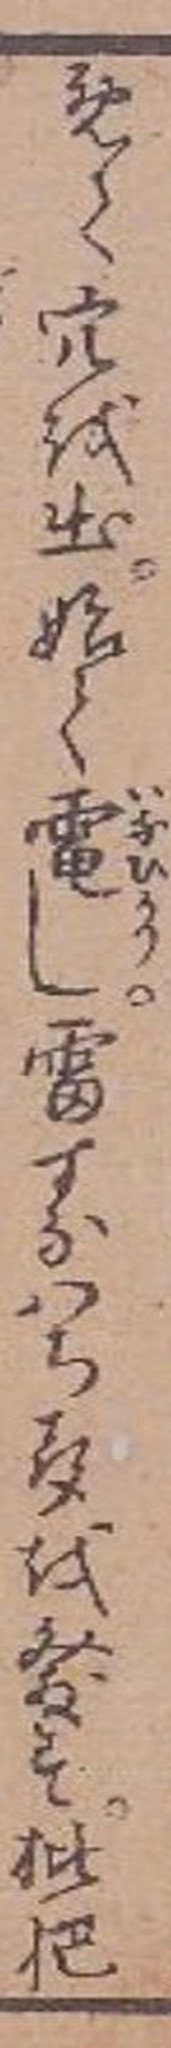めて穴を出。始て雷し。雷すなはち声を発す。枇杷
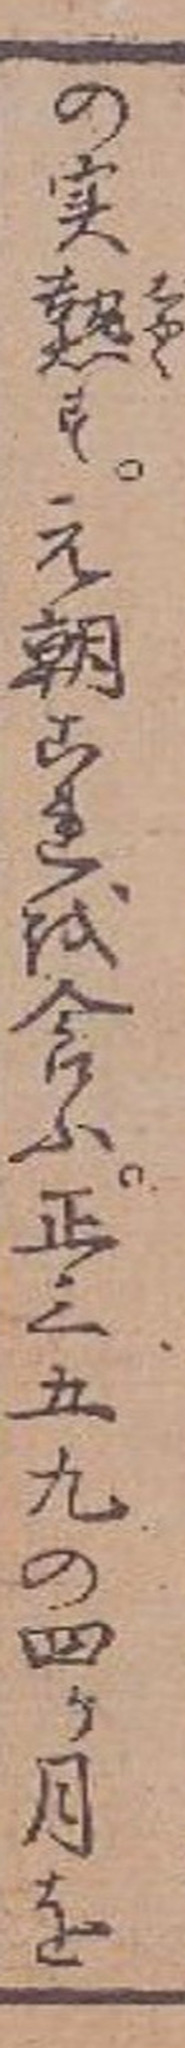の実熟す。元朝これを食ふ。正三四五九の四ケ月を

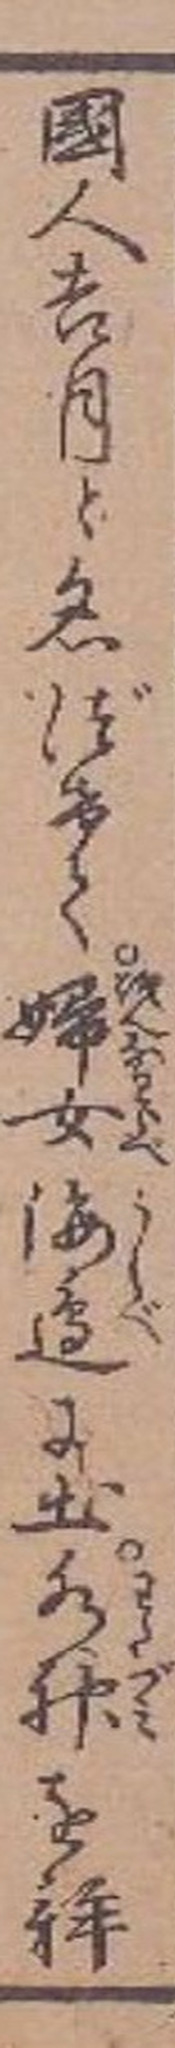国人吉月と名づけて。婦女海辺に出。水神を拝
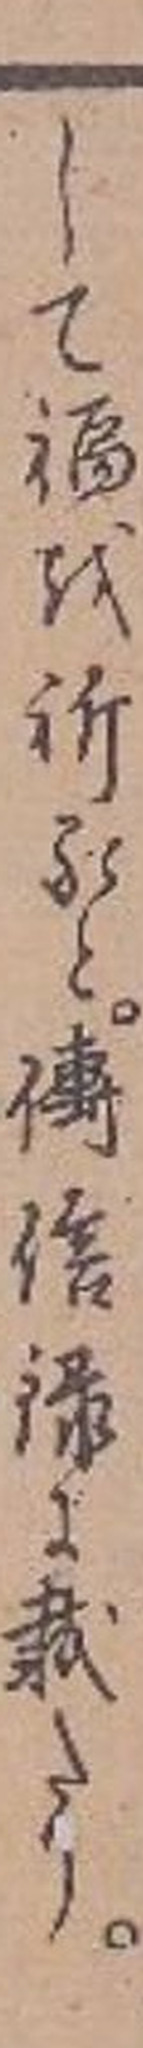して福を祈ると。伝信録に載たり。
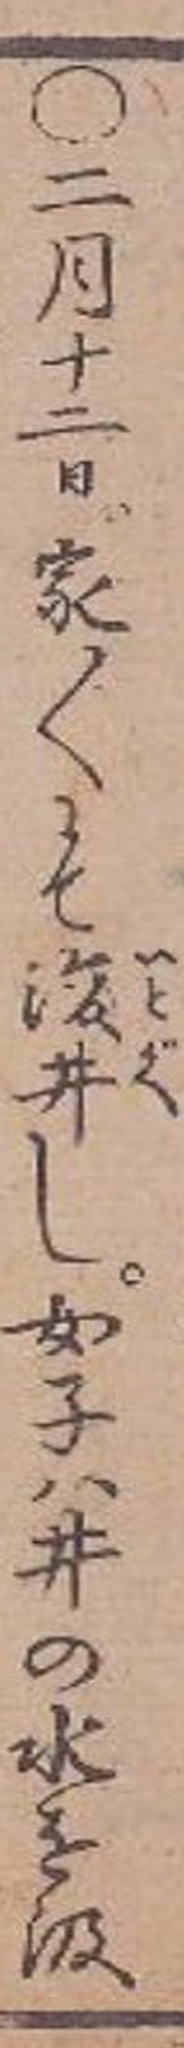〇二月十二日。家〳〵にて浚井し。女子は井の水を汲
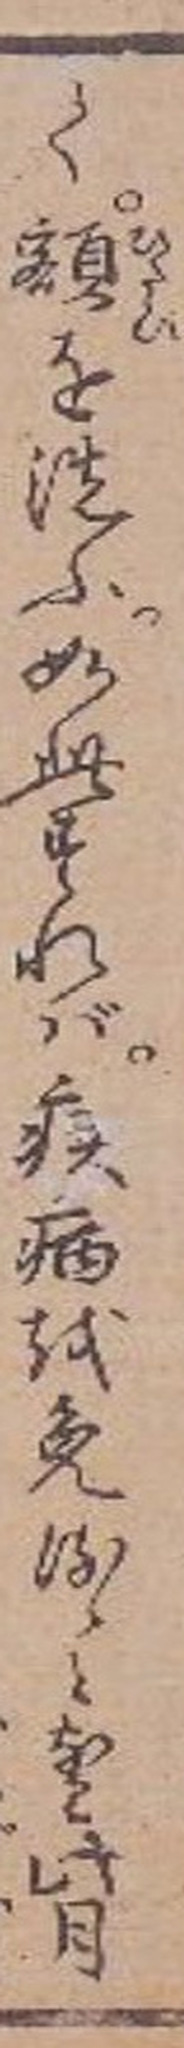て。額を洗ふ。如此すれば。疾病を免るゝとなり此月。
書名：琉球談
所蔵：University of the Ryukyus Library
